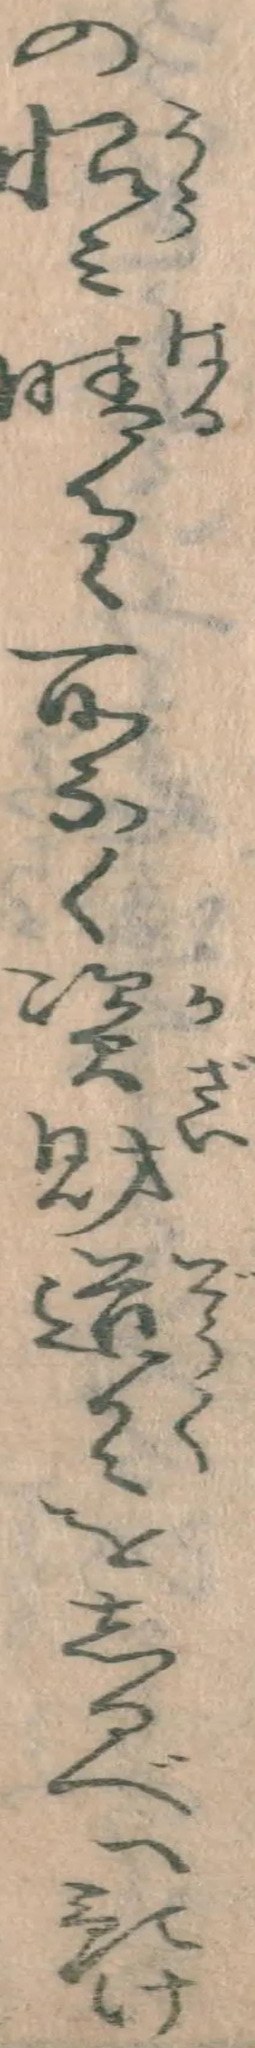の恨み晴るゝ所なく資財道具をしるべへ預け
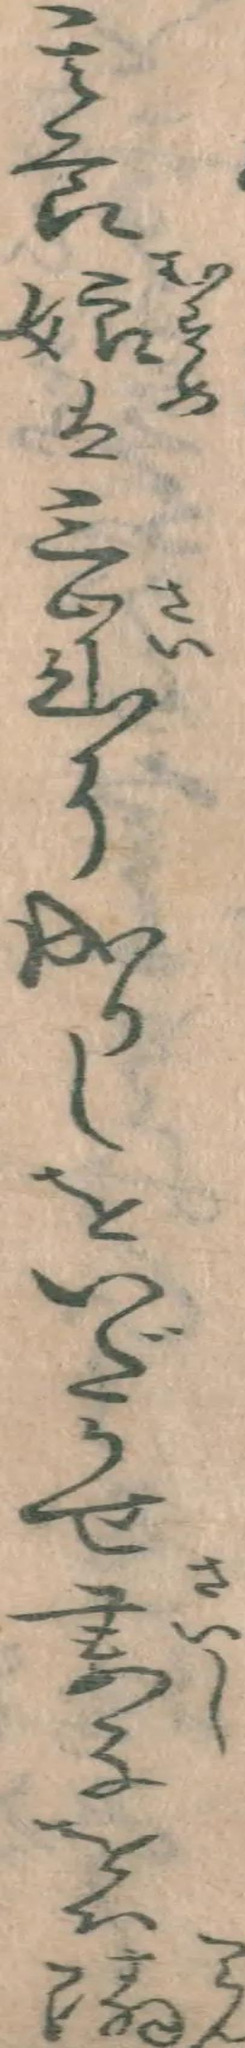其節娘は三歳に成りしをいだかせ妻子をは隣
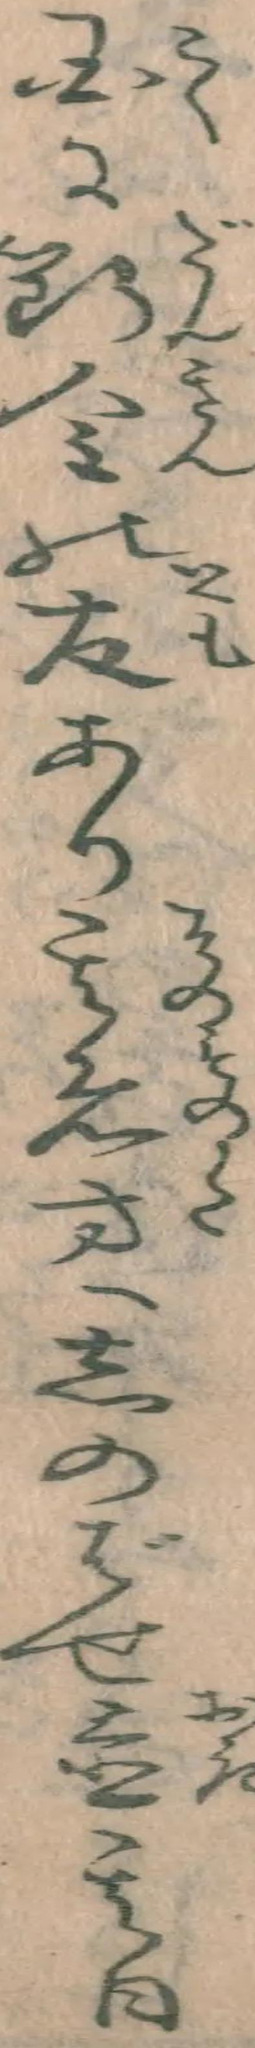国に断金の友あり其者方へしのばせ置其日
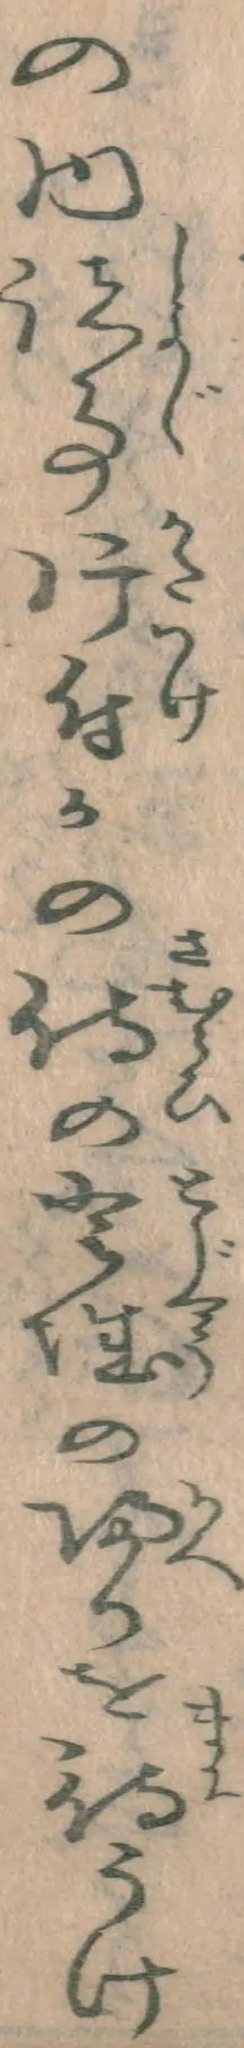の内諸事片付かの侍の登城の帰りを待うけ
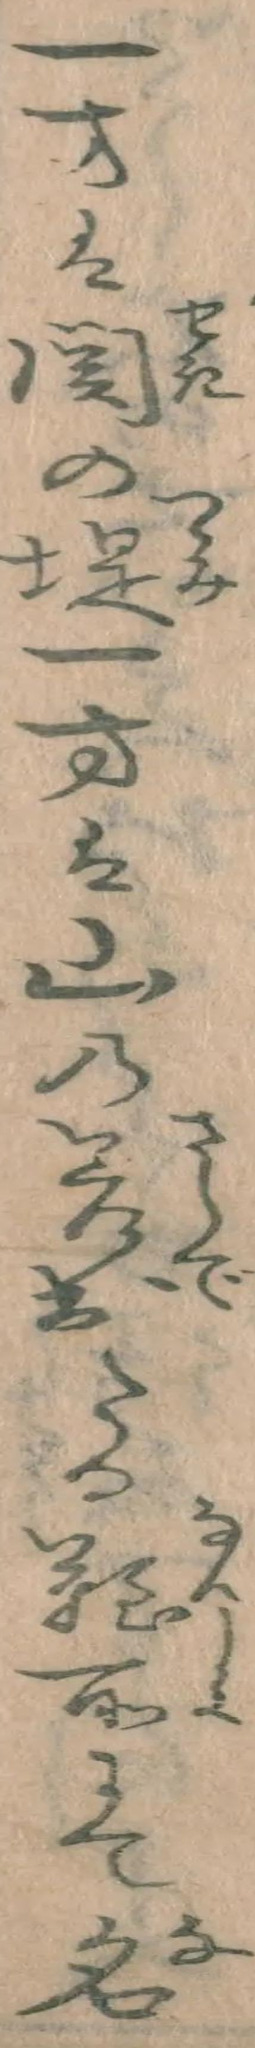一方は関の堤一方は山の差出たる難所にて名
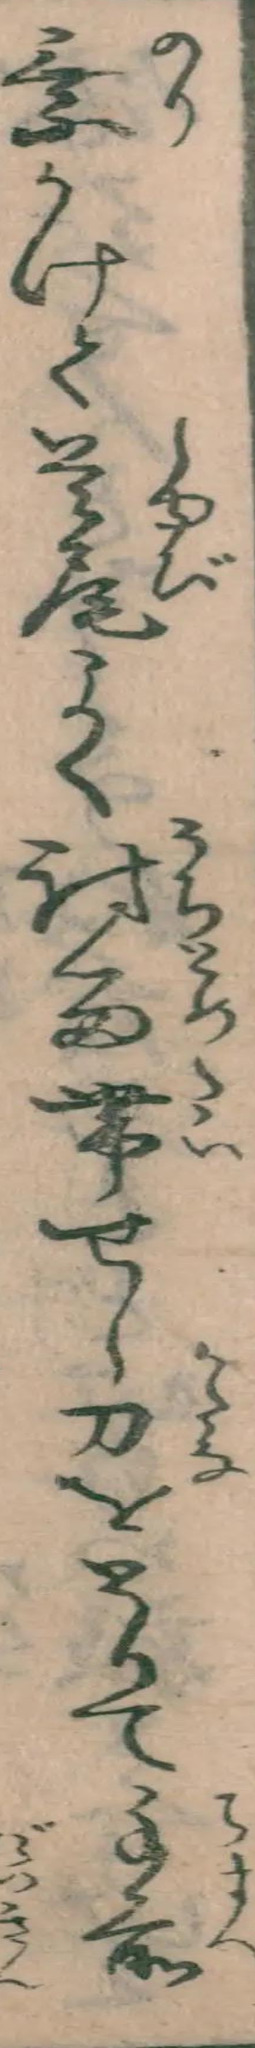乗かけて首尾よく討留帯せし刀をとりて手前
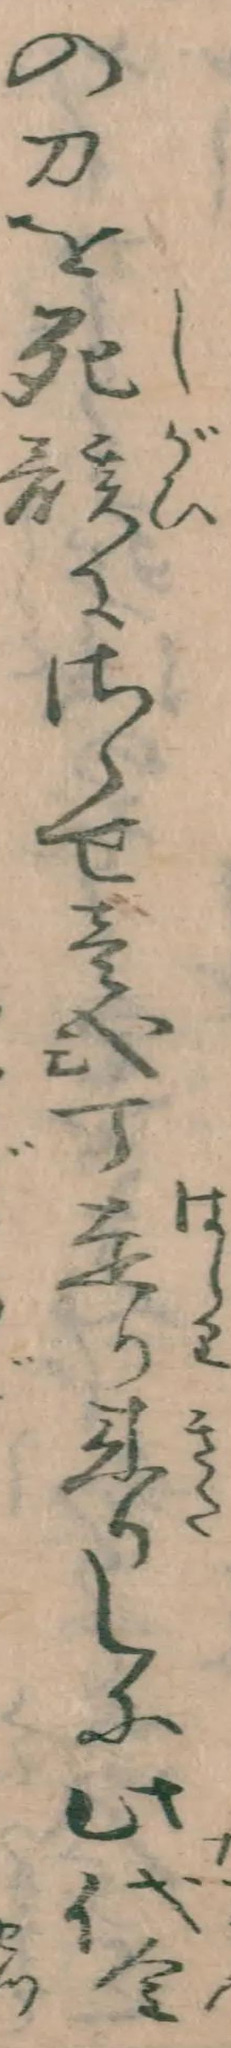の刀を死骸にさゝせ壱弐丁走り来りしに此代金
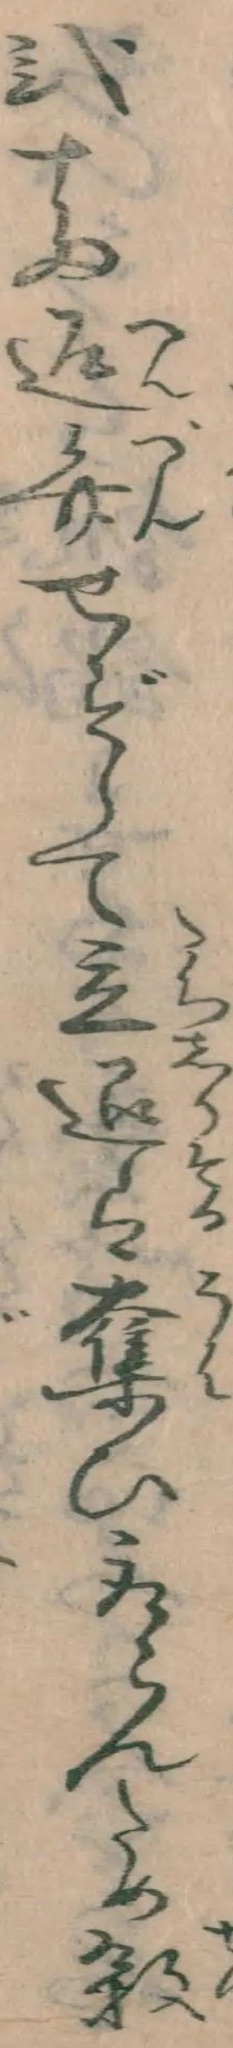弐十両返弁せずして立退は奪ひ取らんため殺
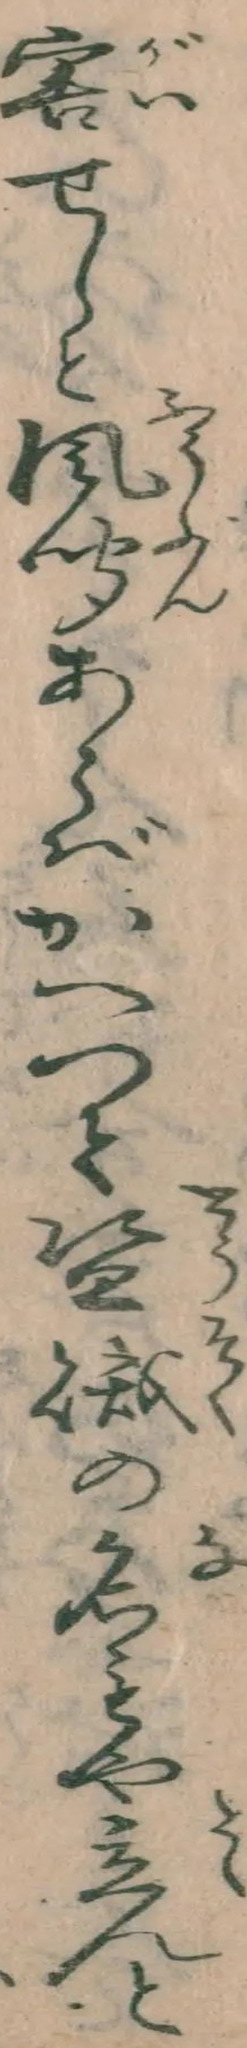害せしと風聞あらばかへつて盗賊の名もや立んと
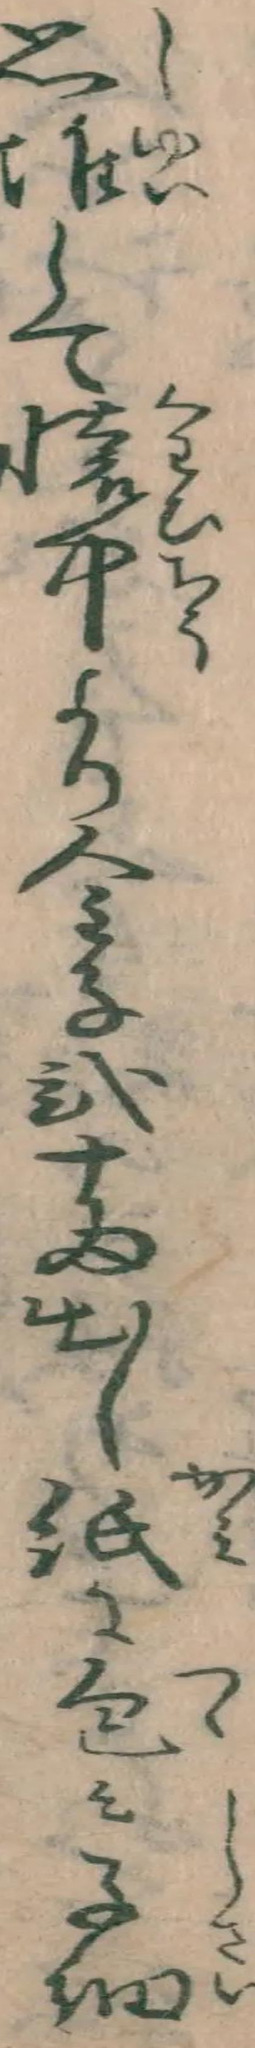思惟して懐中より金子弐十両出し紙に包み子細
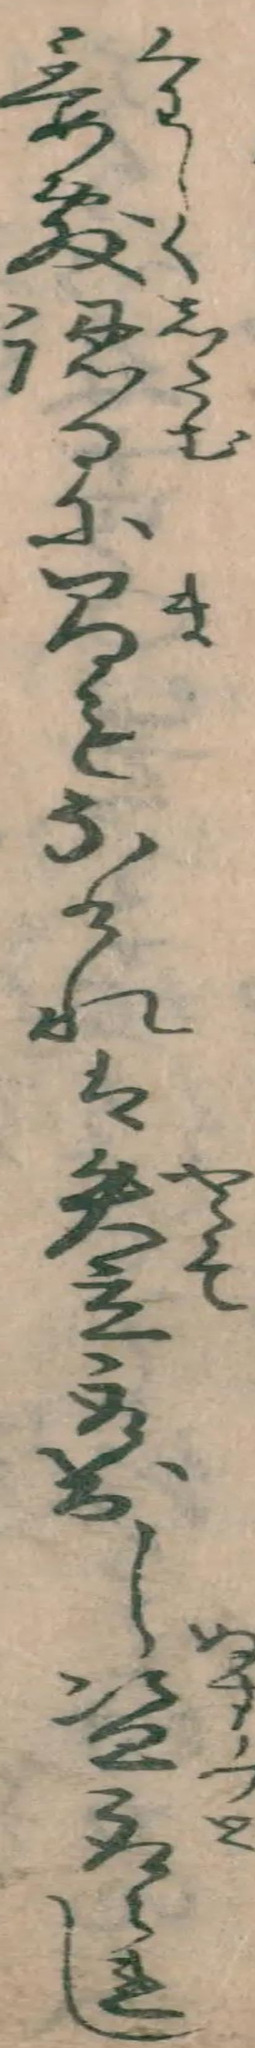委敷認るに間もなけれは矢立取出し盗取られし
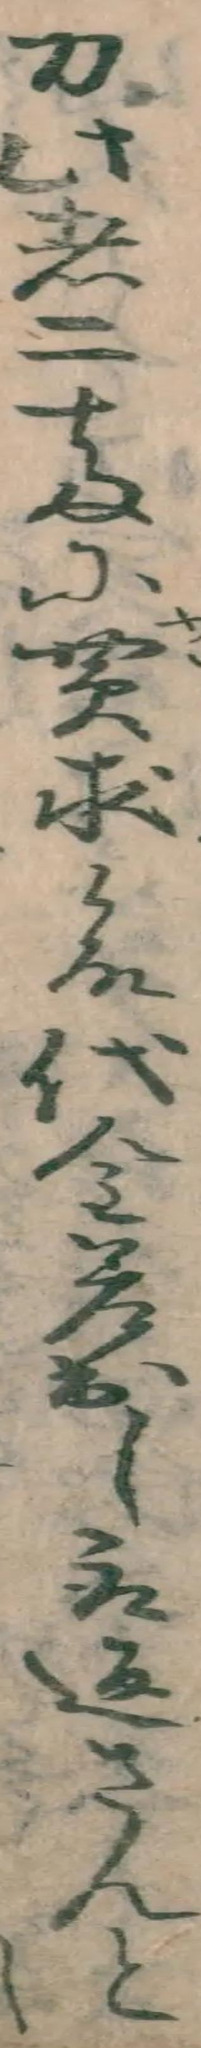刀此者二十両に買求候故代金差出し取返さんと
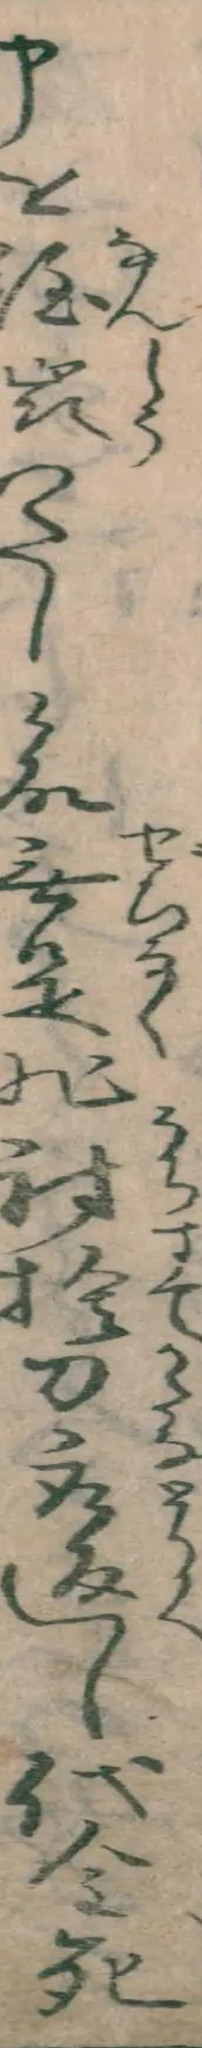申を難渋いたし候故無是非討捨刀取返し代金死
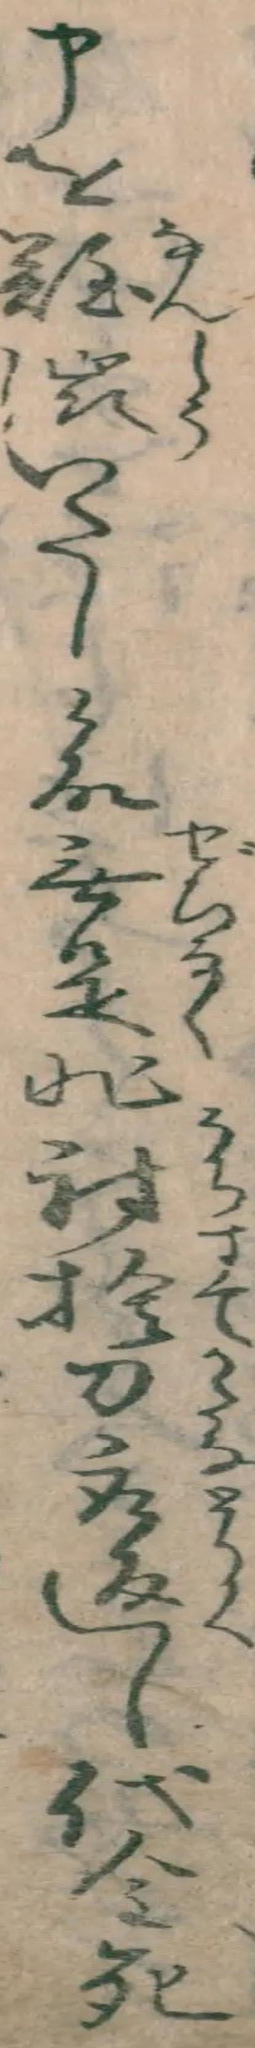申を難渋いたし候故無是非討捨刀取返し代金死
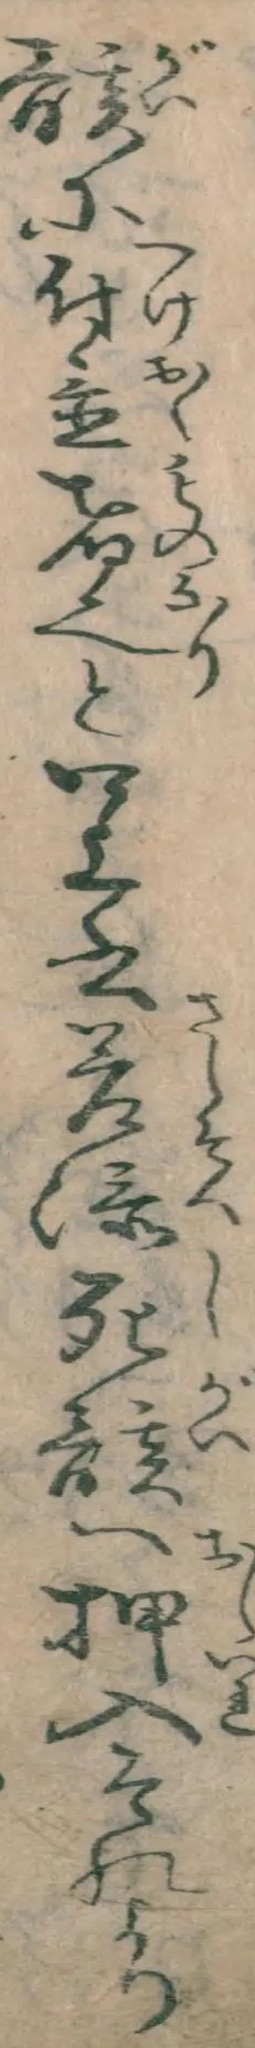骸に付置者也と口上書差添死骸へ押入それより
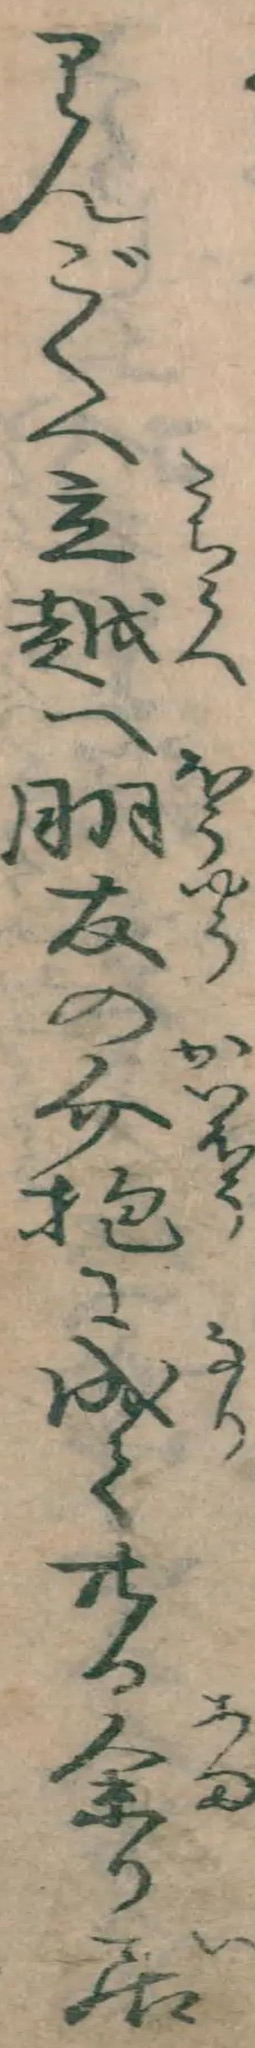りんごくへ立越へ朋友の介抱に成て廿日余り居
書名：怪談御伽童 5巻. [2]
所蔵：国立国会図書館 National Diet Library, JAPAN
